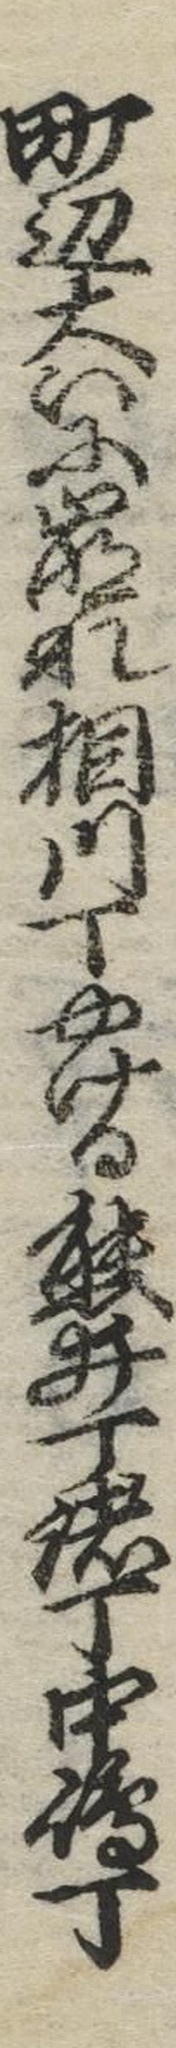町辺大いに崩れ相川丁やける熊井丁諸丁中嶋丁
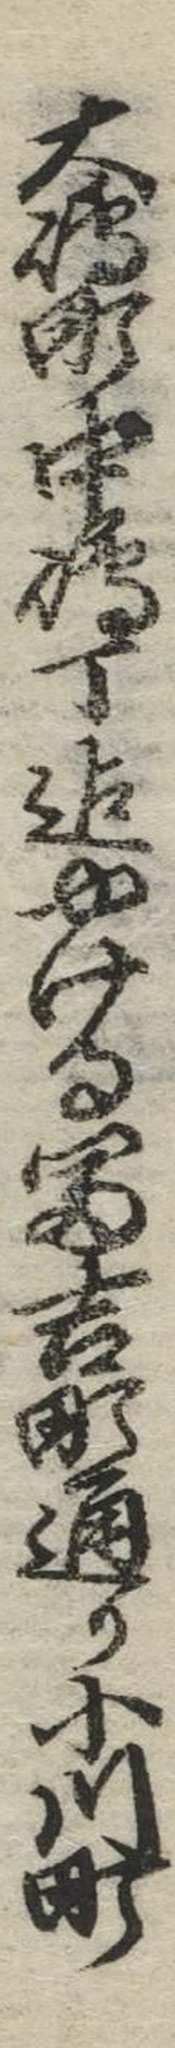大嶋町中嶋丁迄やける富吉町通り小川町
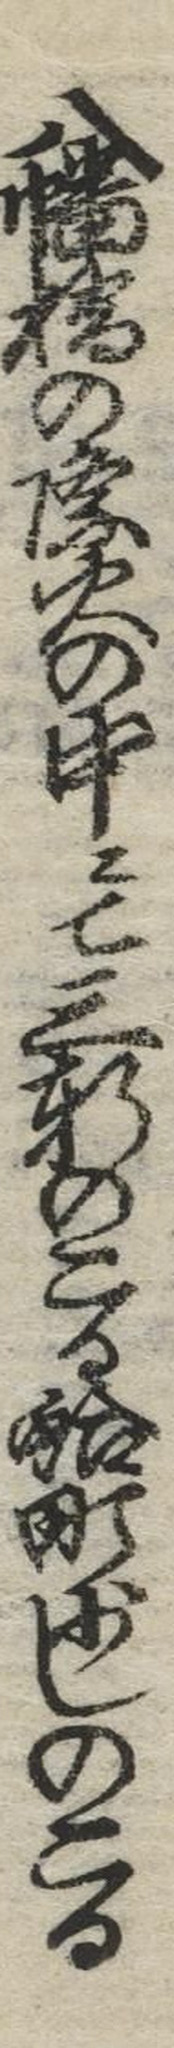八幡橋の際火の中ニて三軒のこる蛤町少しのこる
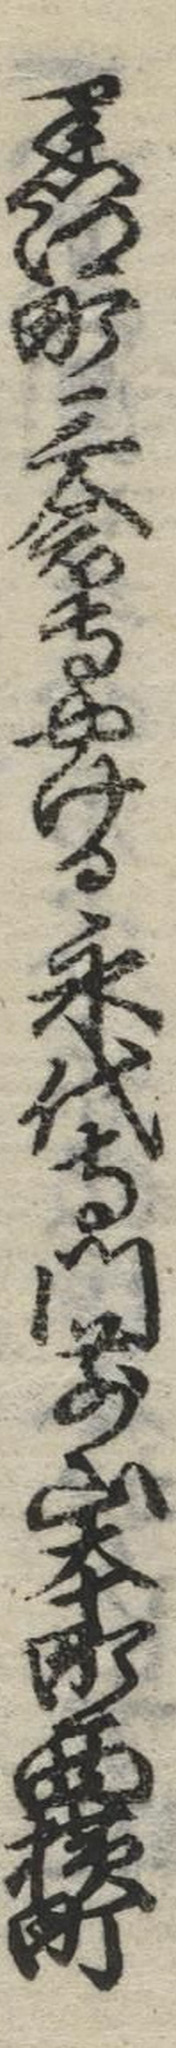黒江町三倉寺やける永代寺門前山本町西横町
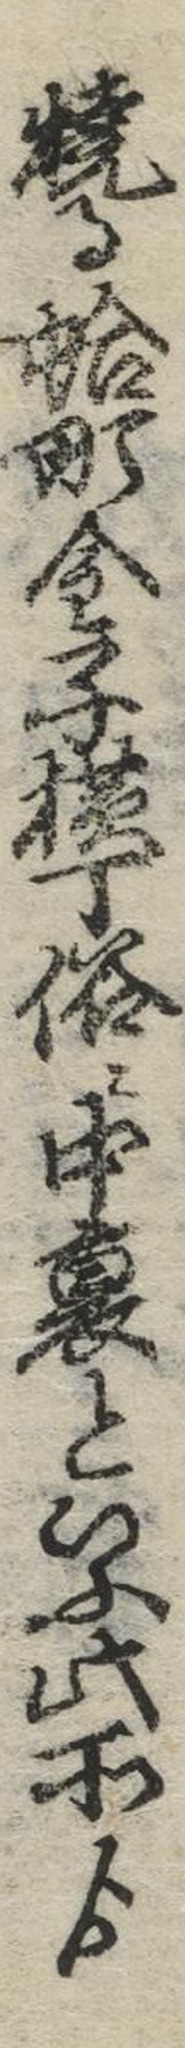焼る蛤町金子横丁俗ニ中裏といふ此所ゟ
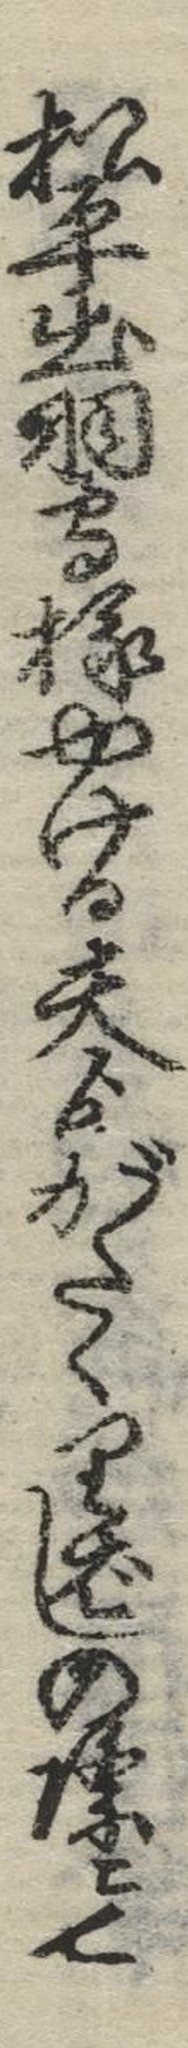松平出羽守様やける夫ゟがたくりばしの際ニて
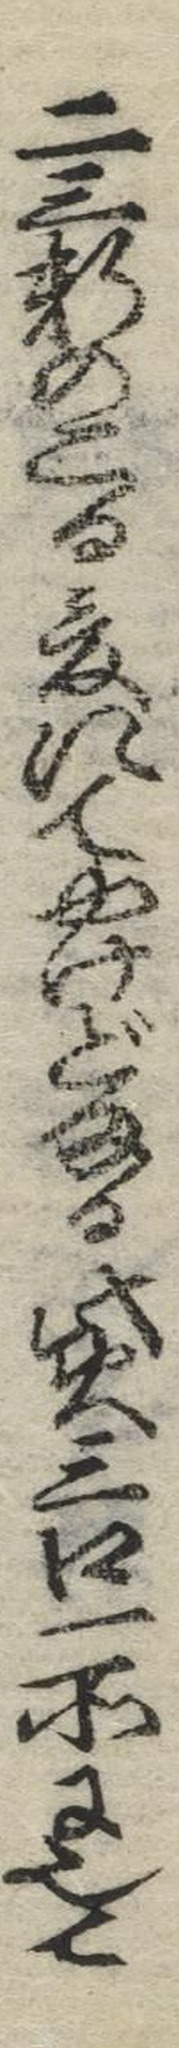ニ三軒のこる爰にてやけどまる此火三口一所に也て
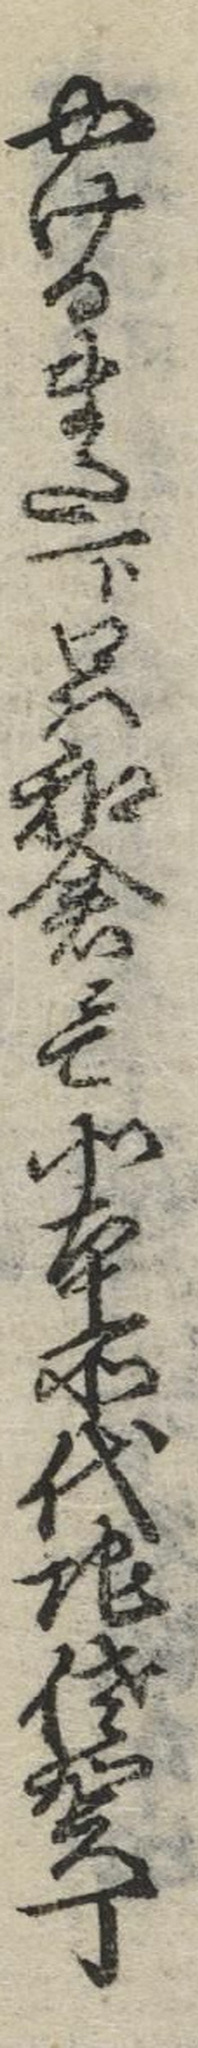やけるまた一ト口ハ和倉ニて北本所代地佐賀丁
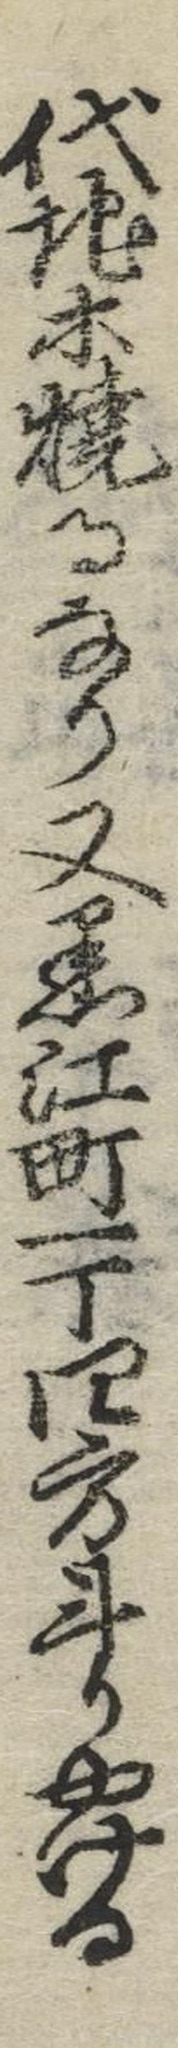代地等焼るなり又黒江町一丁四方斗りやける
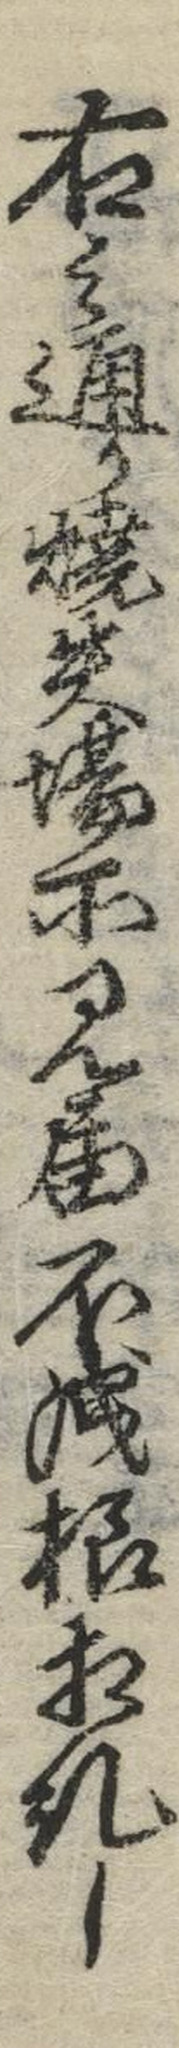右之通り焼失場所見届不洩様相糺し
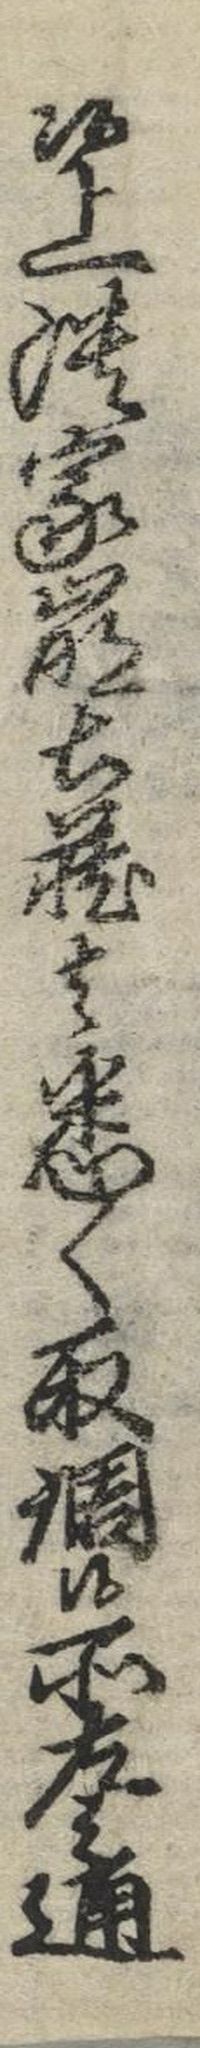候上潰家崩土蔵は悉く取調候所左之通
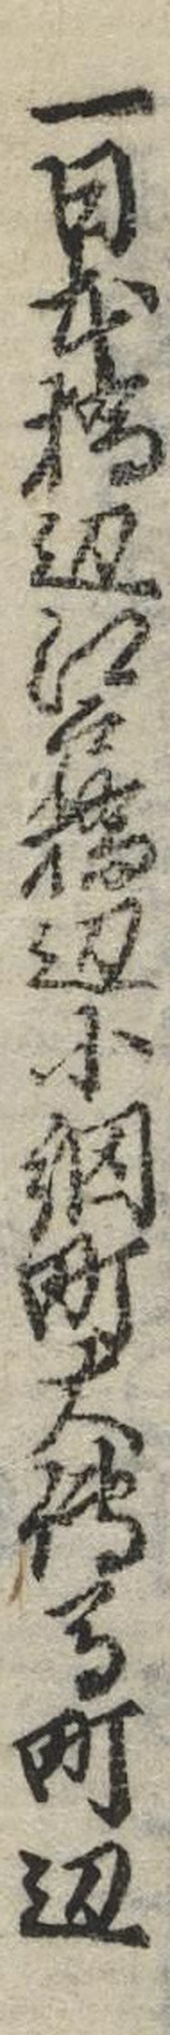一日本橋辺江戸橋辺小網町大傳馬町辺
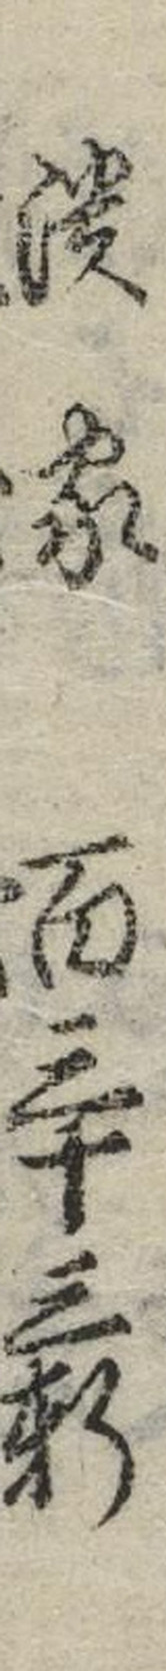潰家百三十三軒
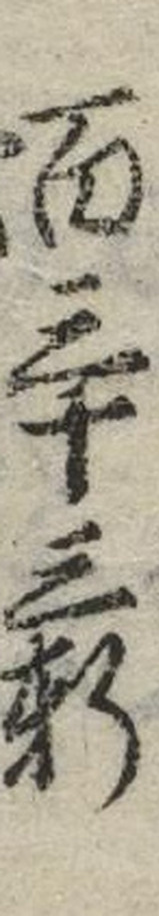潰家百三十三軒
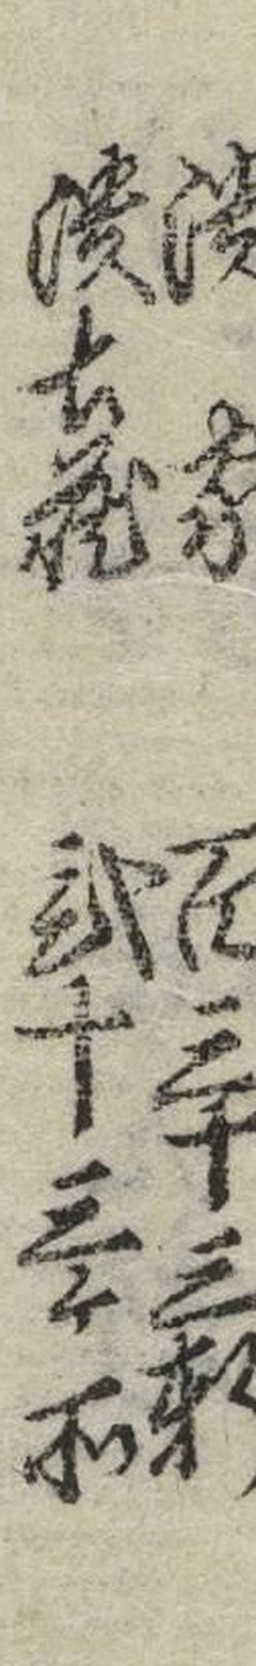潰土蔵弐十三ケ所
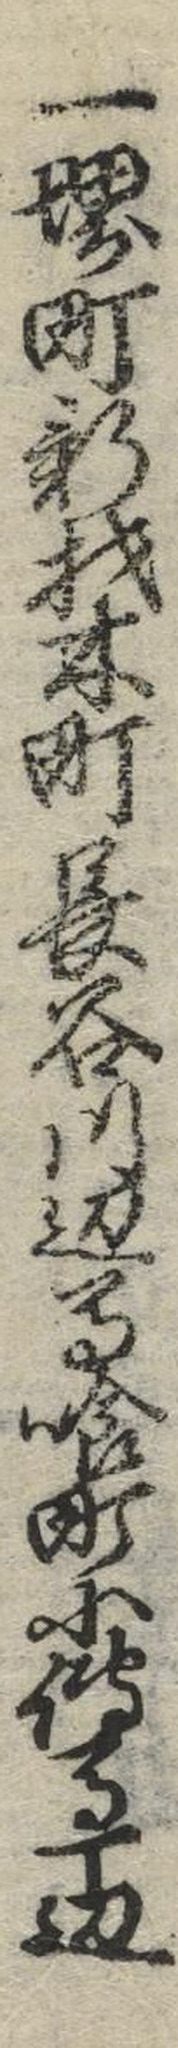一堺町新材木町長谷川辺馬喰町小傳馬丁辺
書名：江戸御屋鋪方町方共　地震類焼場所巨細書之寫　潰家潰土蔵共取調附街道筋近在迄
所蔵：東京大学地震研究所図書室 Earthquake Research Institute Library, The University of Tokyo, JAPAN
